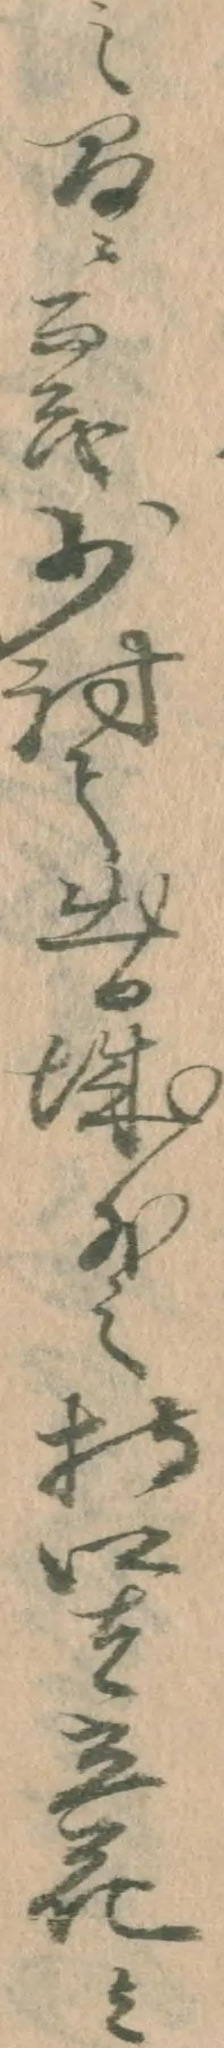之間に而茂少討て出る城外之持口者立花与
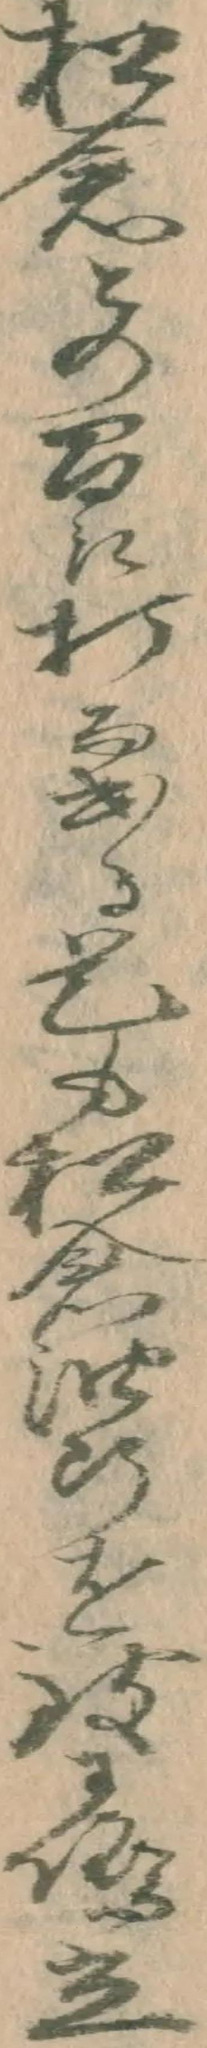松倉との間江打而出る是も松倉油断を致尓依而立
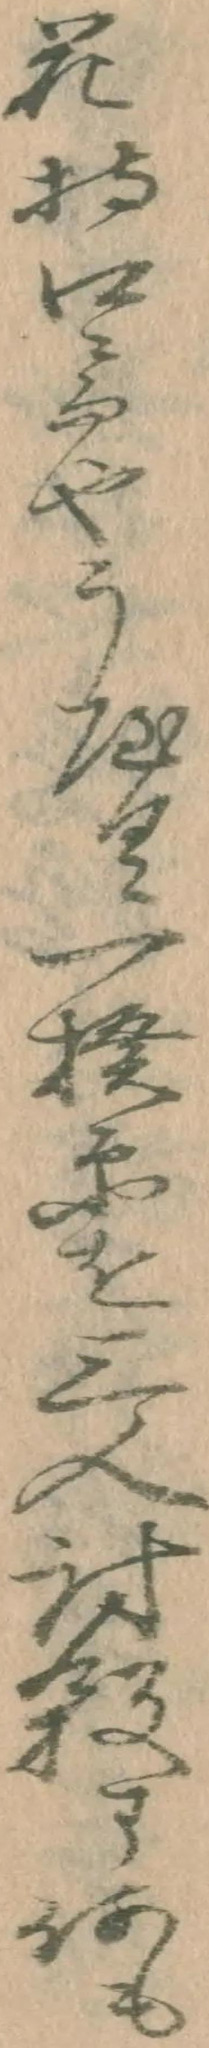花持口に而やう屋具一揆原を三人討殺す何も
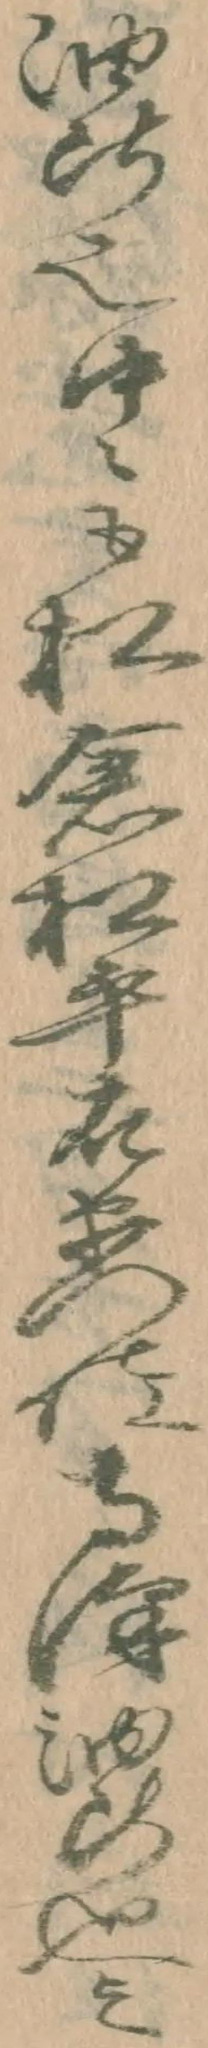油断也中にも松倉松平左衛門佐寺沢油断也与
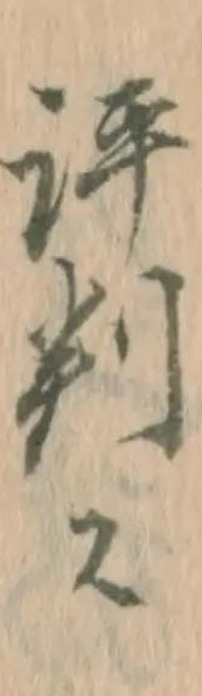評判す
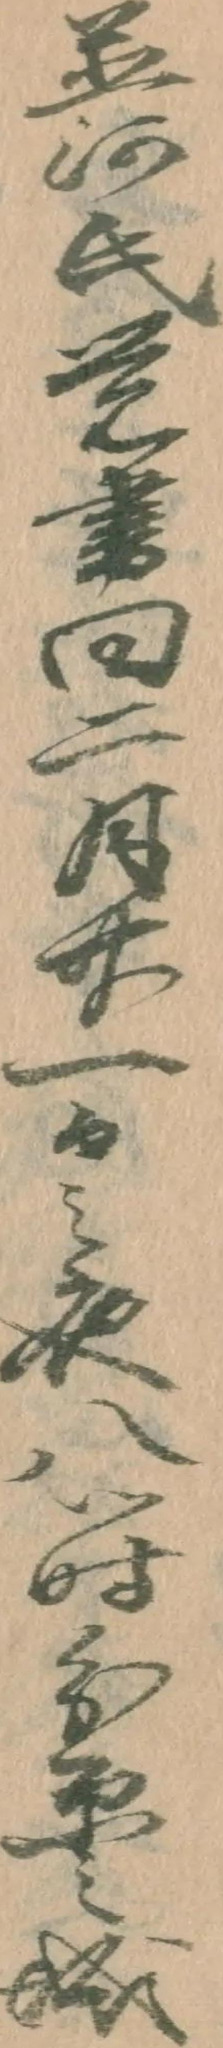並河氏覚書曰二月廿一日之夜八つ時分原之城
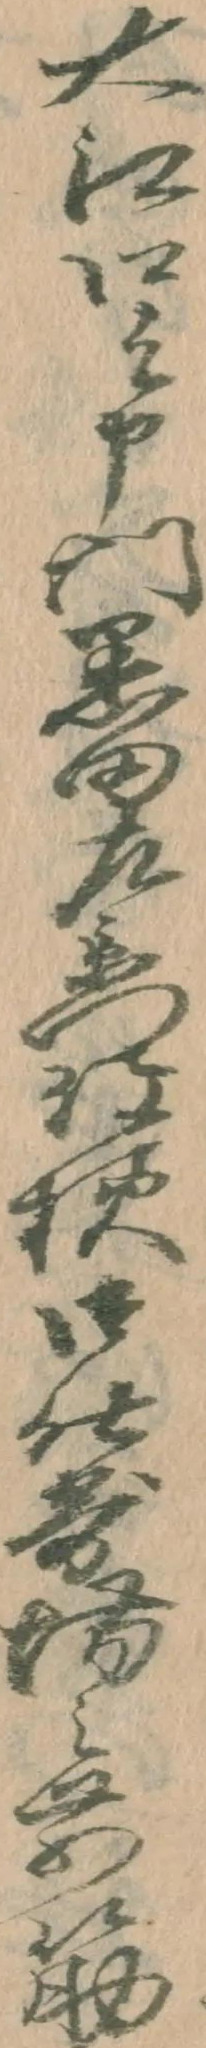大江口与申門黒田左衛門佐様御仕寄場之前筋
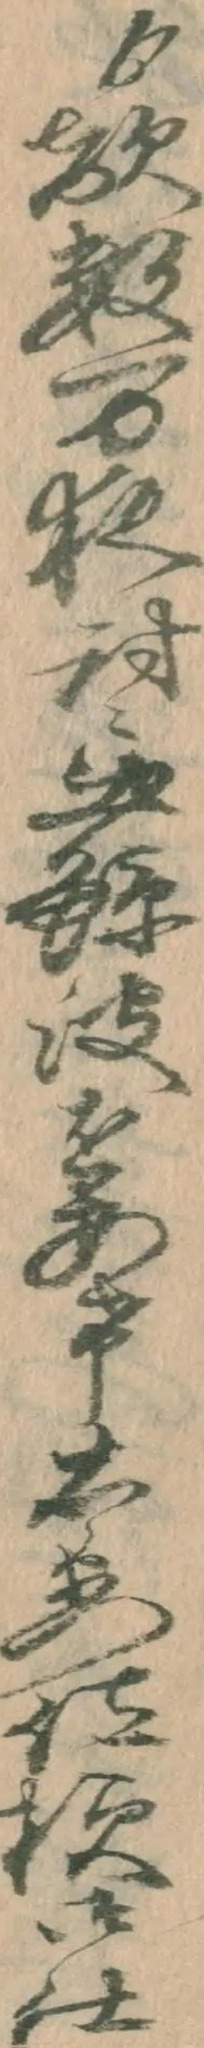ゟ敵数万夜討に出鯨皮をあ希右衛門佐様御仕
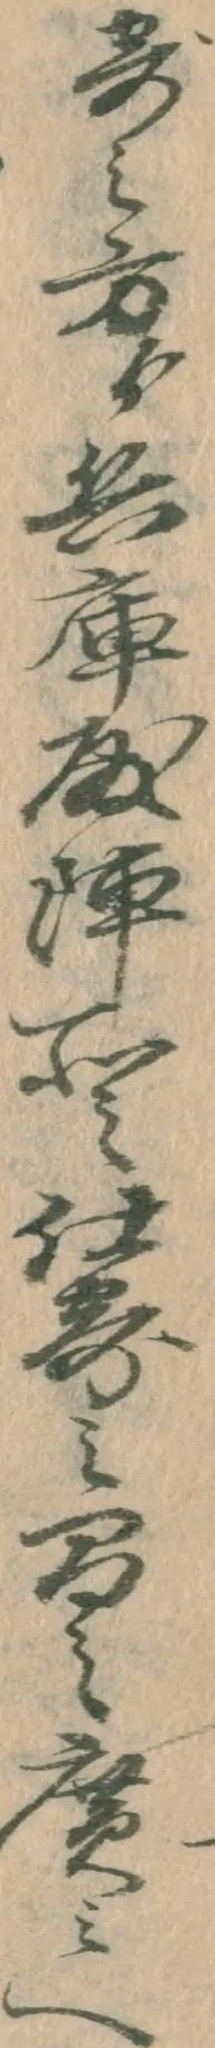寄之方ゟ兵庫殿陣所之仕寄之間之広みへ
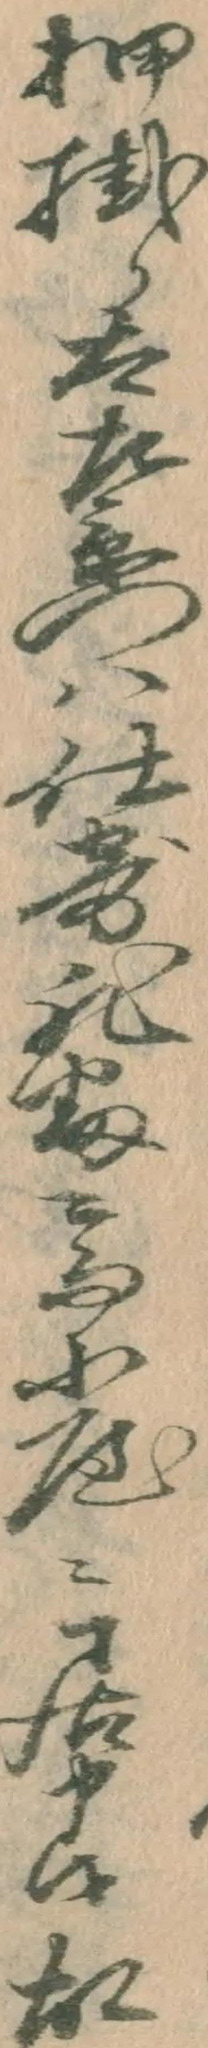押掛り太左衛門は仕寄非番に而小屋に居申候故
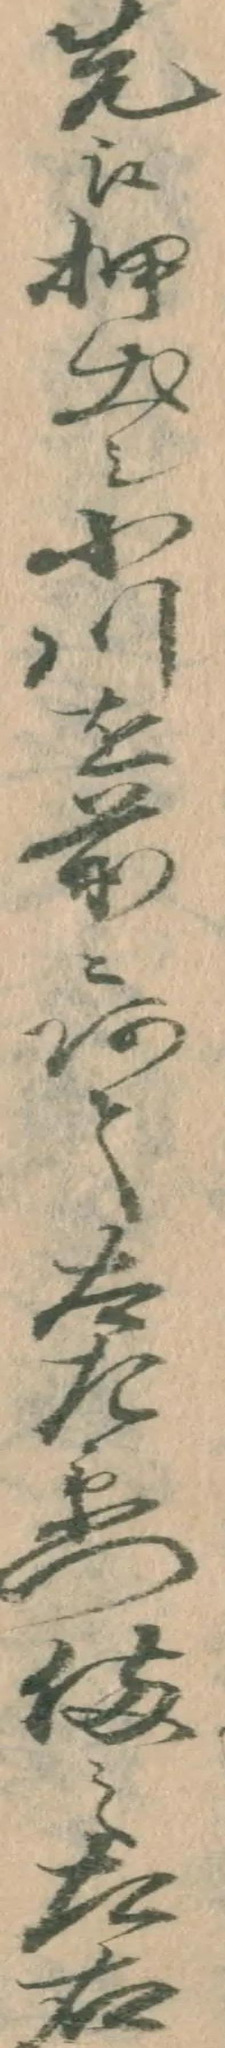先江押出し小川を前に阿て太左衛門備之左右
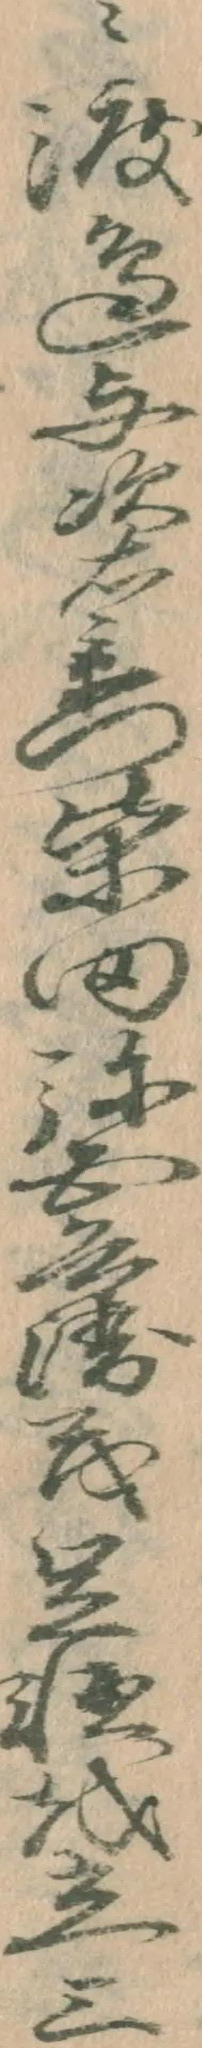に渡辺与次右衛門柴田弥五兵衛茂足軽越立三
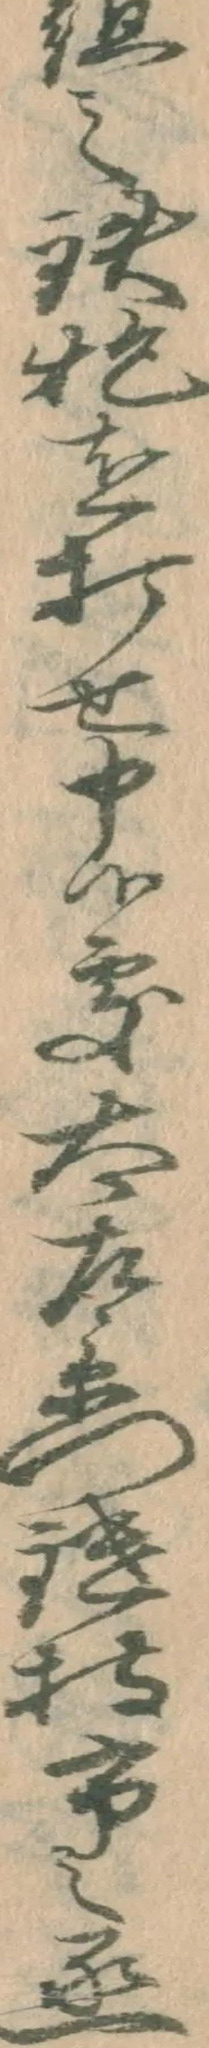組之鉄炮を打せ申候處太左衛門鑓持市之丞
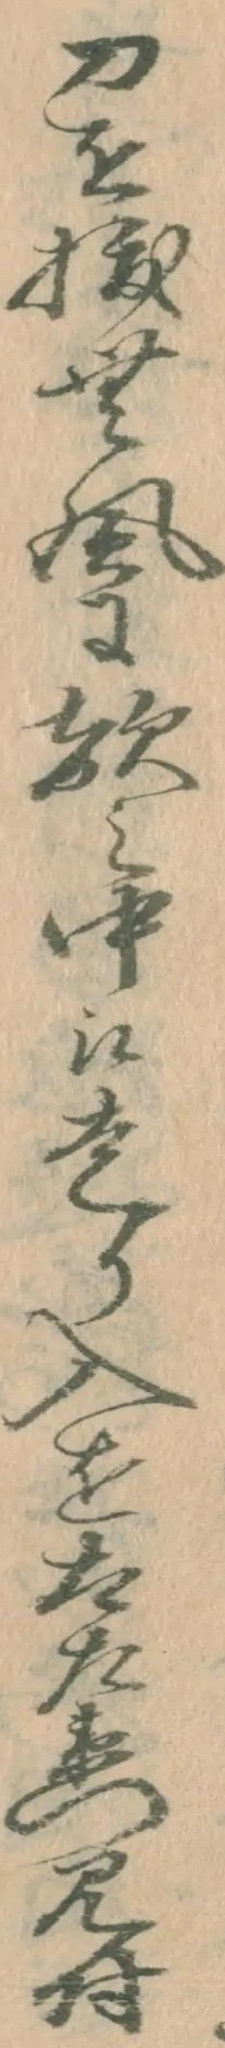刀を抜無風尓敵之中江走り入を太左衛門見付

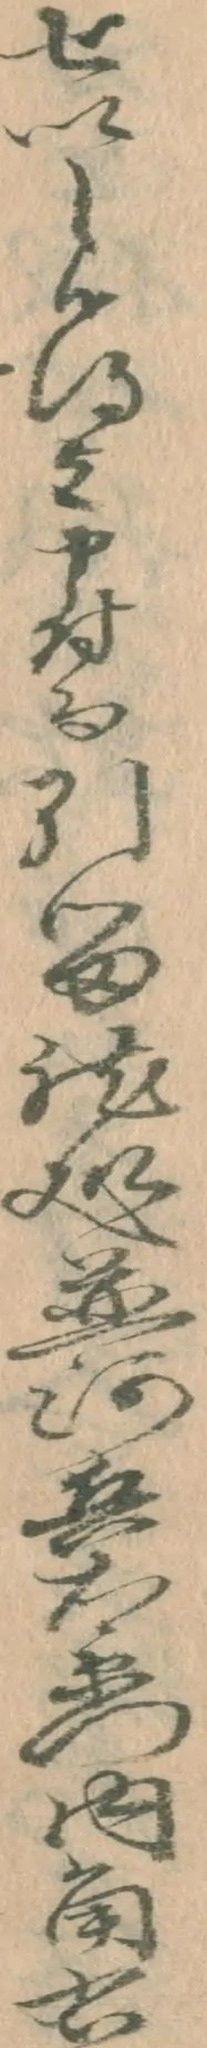せ以し候得与申付而引留然処並河兵右衛門内角右
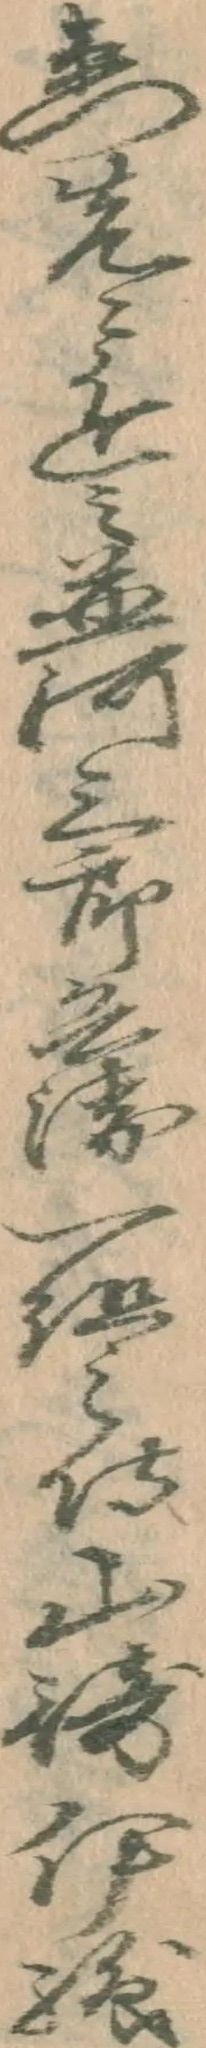衛門先に進み並河三郎兵衛一組之侍山崎伊織
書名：切支丹御退治記 49巻. [7]
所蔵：国立国会図書館 National Diet Library, JAPAN
